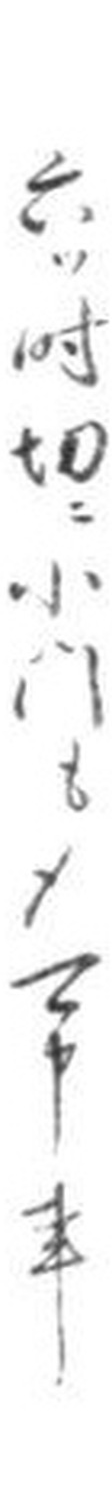六ツ時切ニ小門も〆可申事
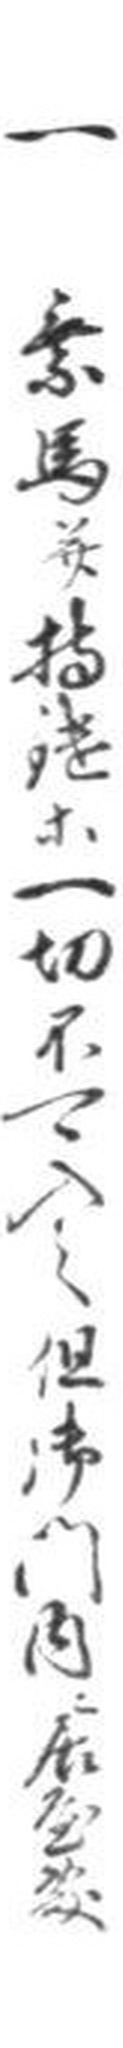一乗馬并持鑓等一切不可入之但御門内ニ居屋敷
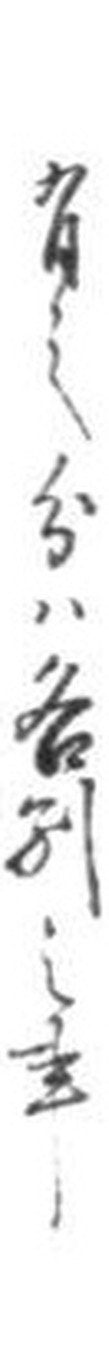有之分ハ各別之事
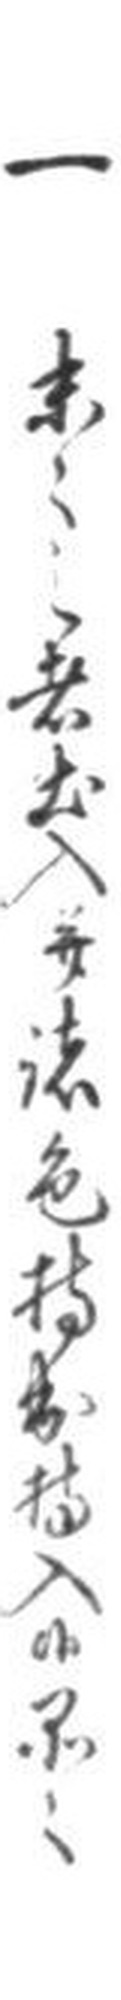一末々之者出入并諸色持出持入候品々
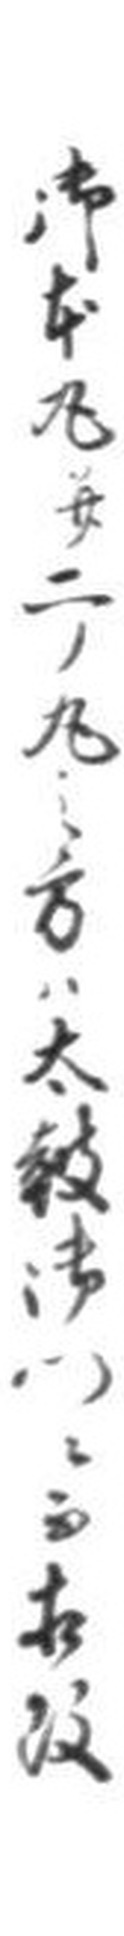御本丸并二ノ丸之方ハ太鼓御門ニ而相改
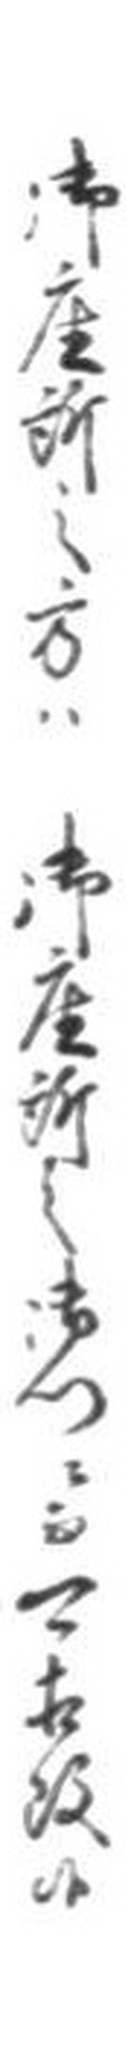御座所之方ハ御座所之御門ニ而可相改候
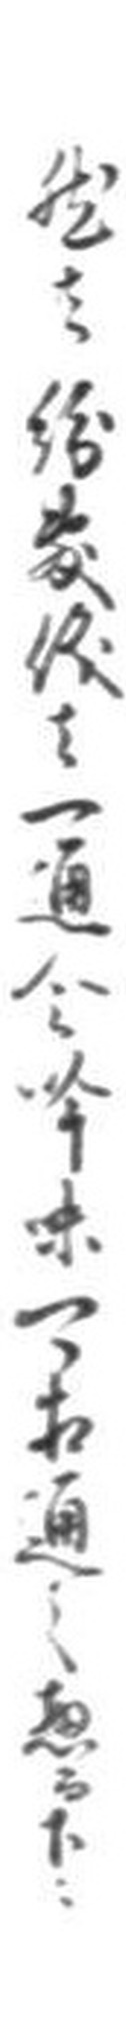然者紛敷儀者一通令吟味可相通之惣而下々
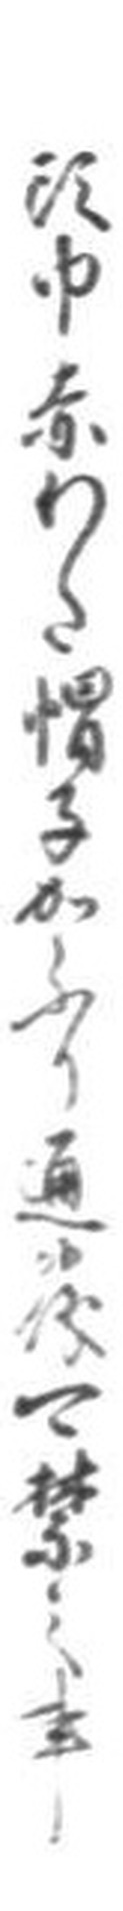頭巾赤わた帽子かふり通候儀可禁之事
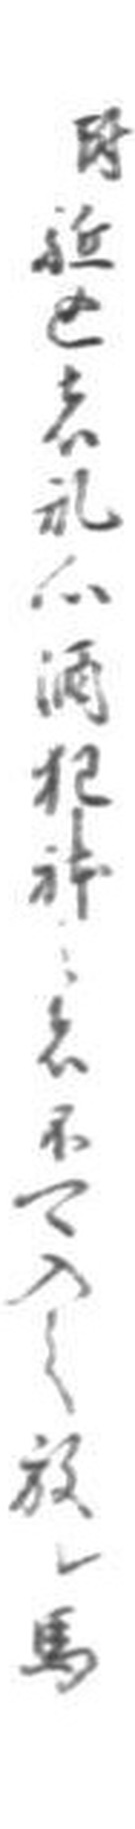駈込者乱心酒狂体之者不可入之放レ馬
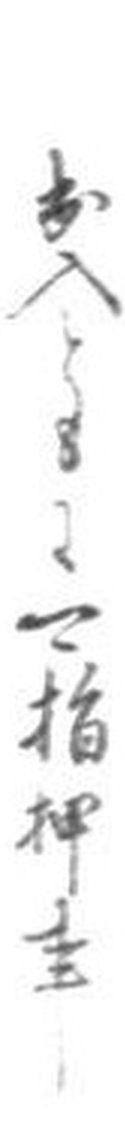出入ともに可指押事
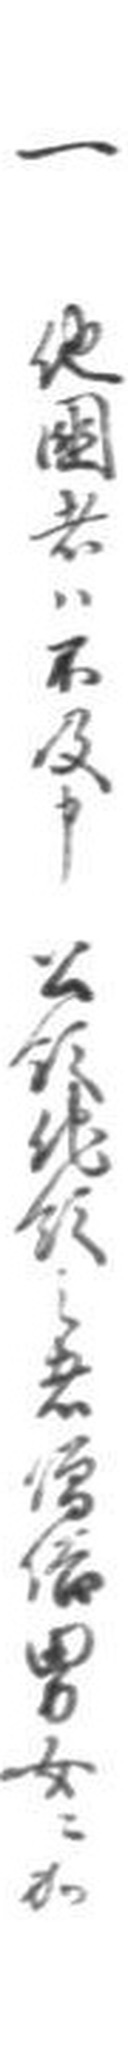一他国者ハ不及申公領他領之者僧俗男女ニか
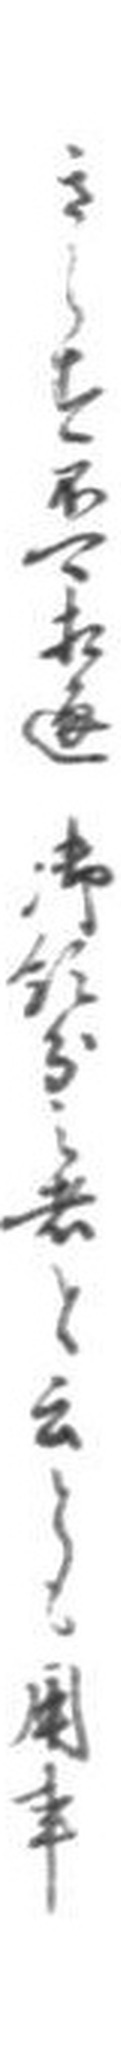きらす不可相通御領分之者と云とも用事
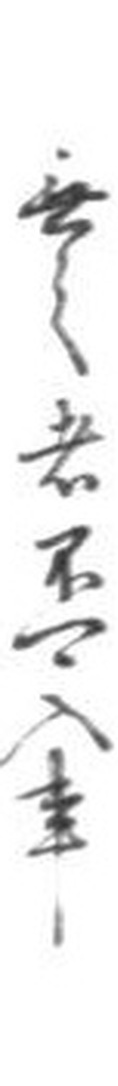無之者不可入事

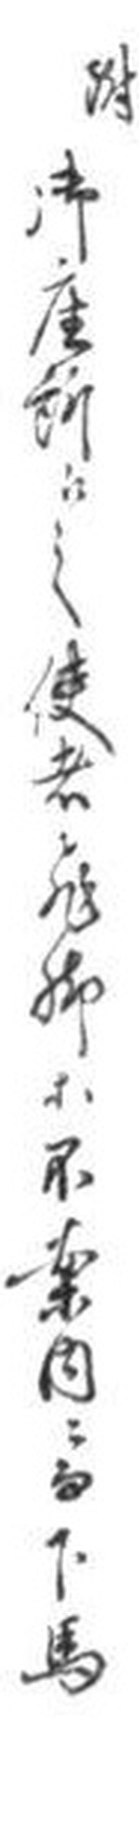御座所江之使者飛脚等不案内ニ而下馬
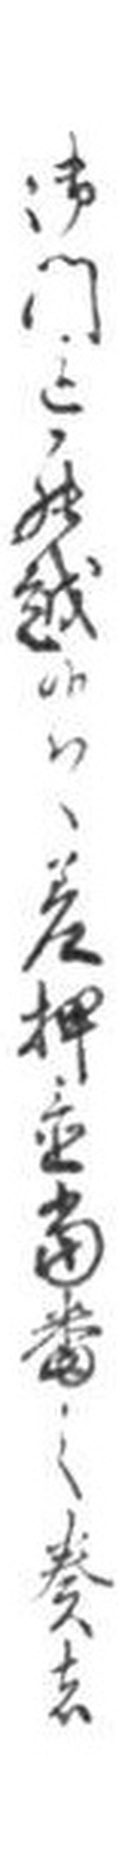御門迄罷越候ハヽ差押置当番之奏者
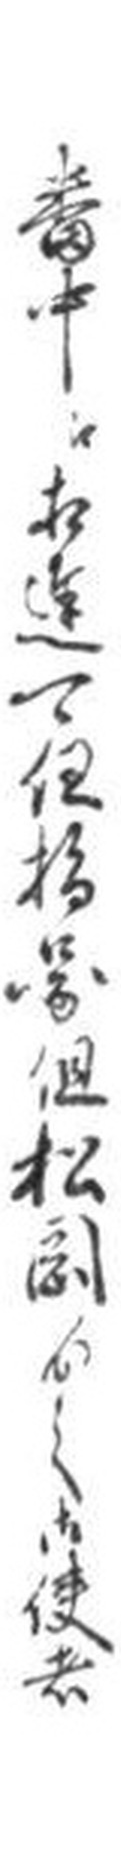番中江相達可任指図但松岡ゟ之御使者
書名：家譜 三十三 吉邦公 享保四年
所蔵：福井県文書館 Fukui Prefectural Archives
